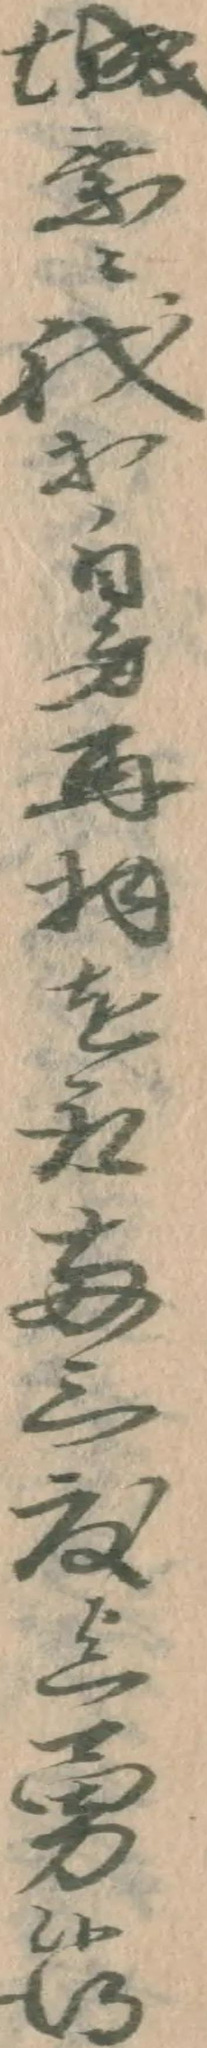城乗に我等自身再拝を取両三度迄勇候得
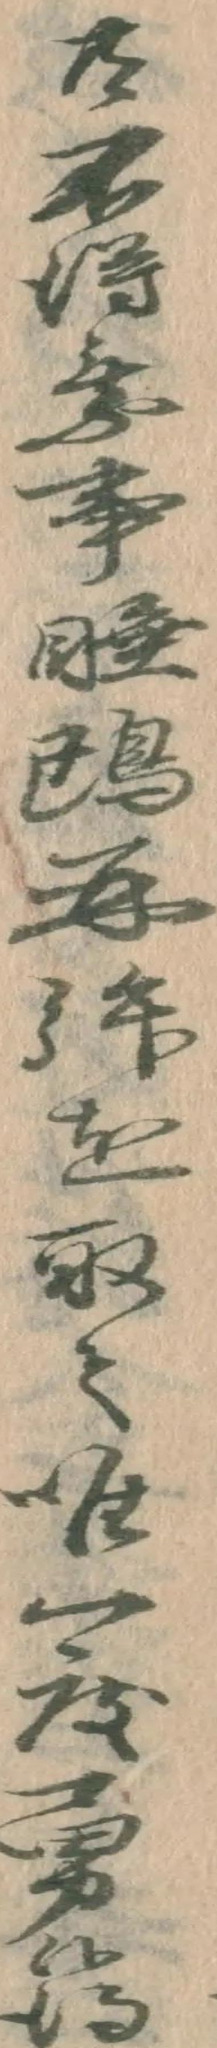共不待乗事睡鴎再拝を取て唯一度勇候得
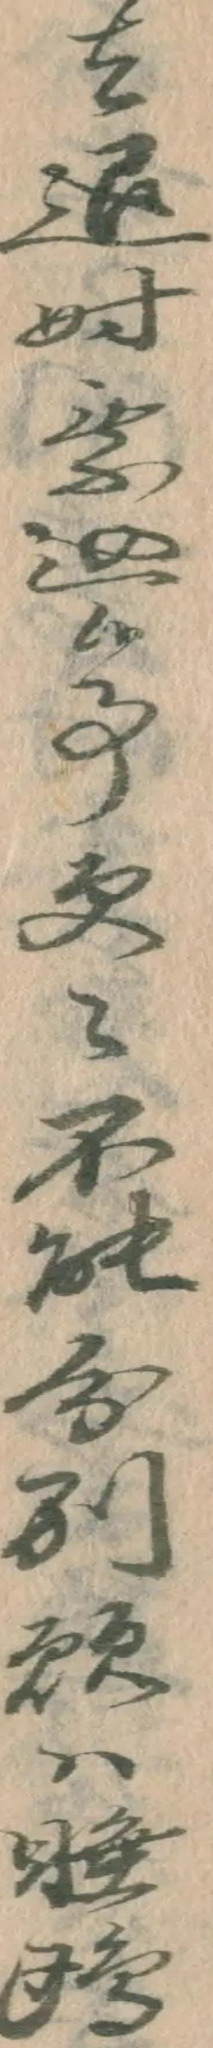者退時乗込候事更々不能分別願は睡鴎
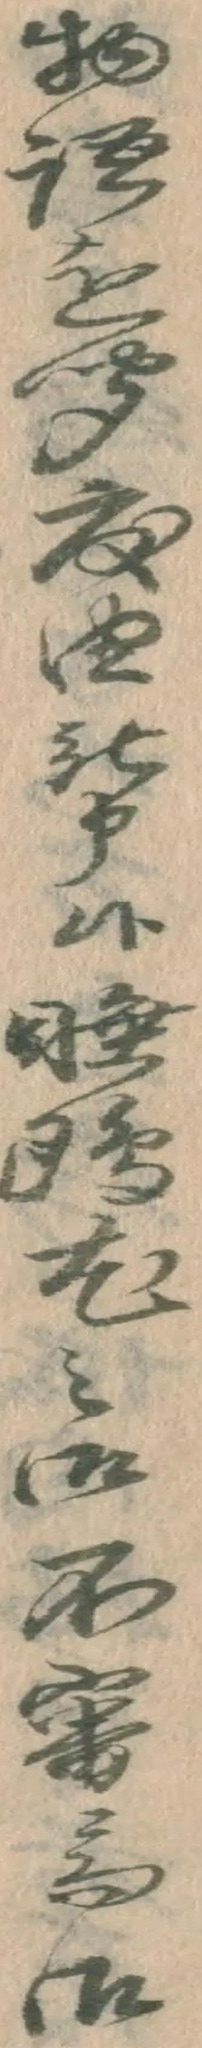物語を聞度由被申候睡鴎尤之御不審に而御
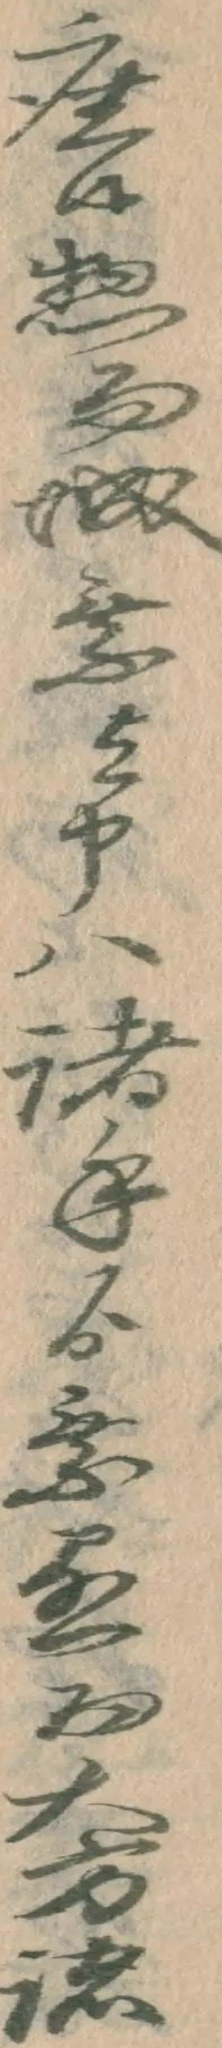座候惣而城乗与申は諸手ゟ乗懸而大方諸
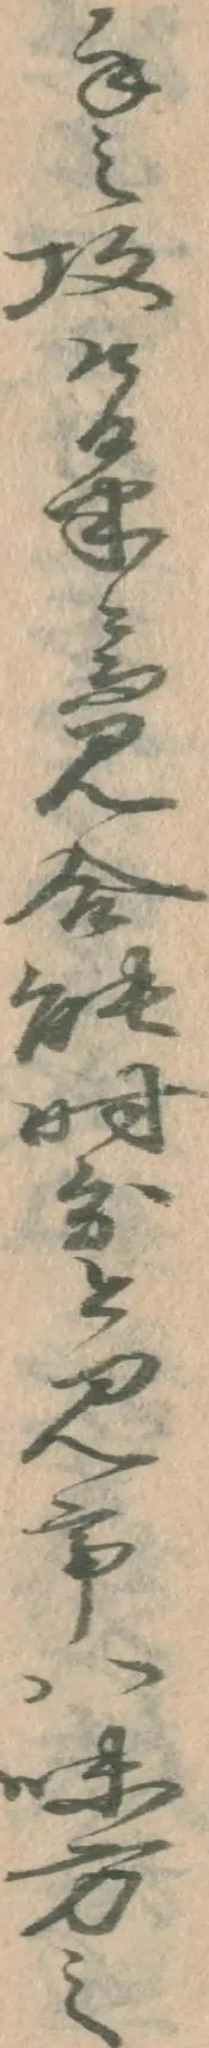手之攻ける半に而見合能時分と見亭は味方之
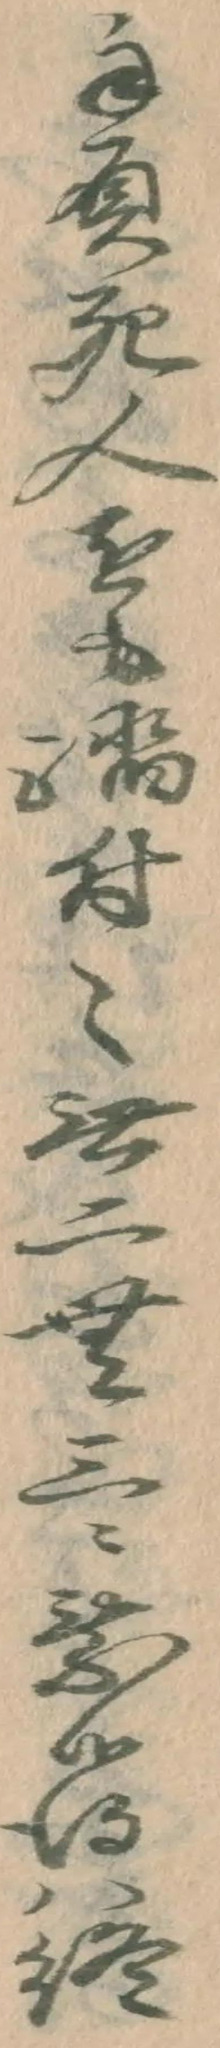手負死人をも踏付て無二無三に乗候得は終

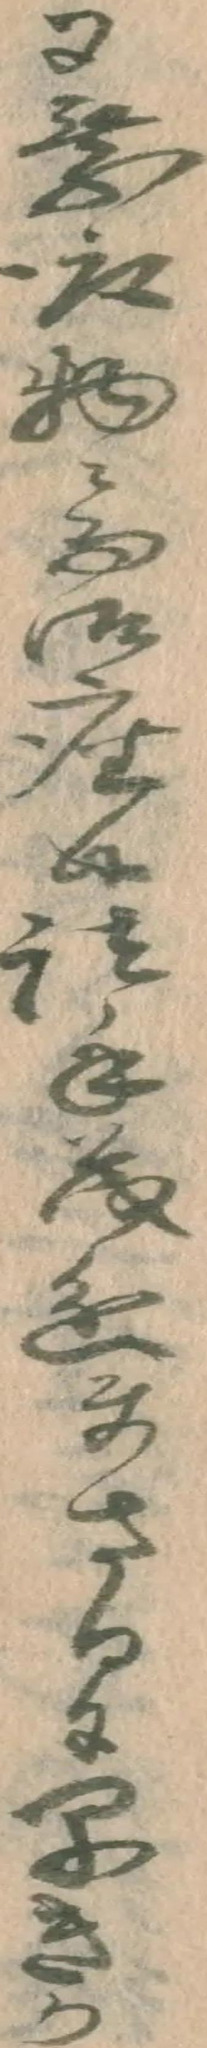尓乗取物に而御座候諸手茂進まさる尓早きか
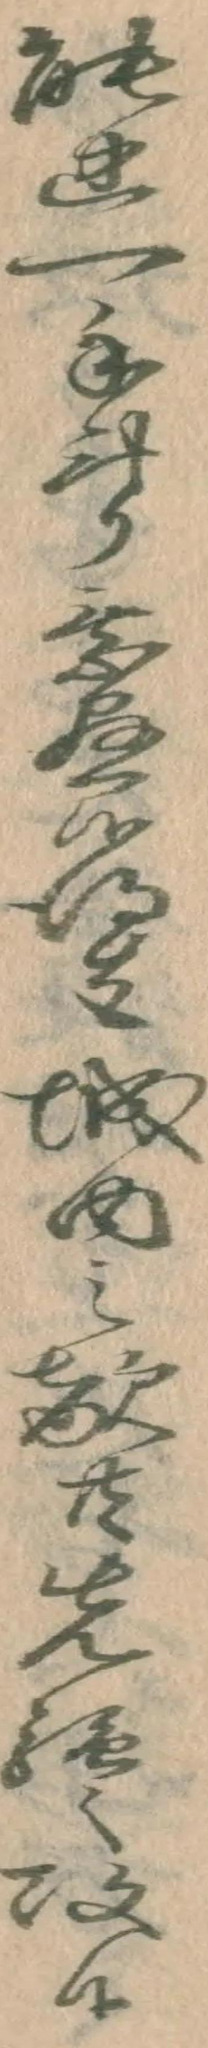能迚一手斗り乗懸候得者城内之敵共先強く攻候
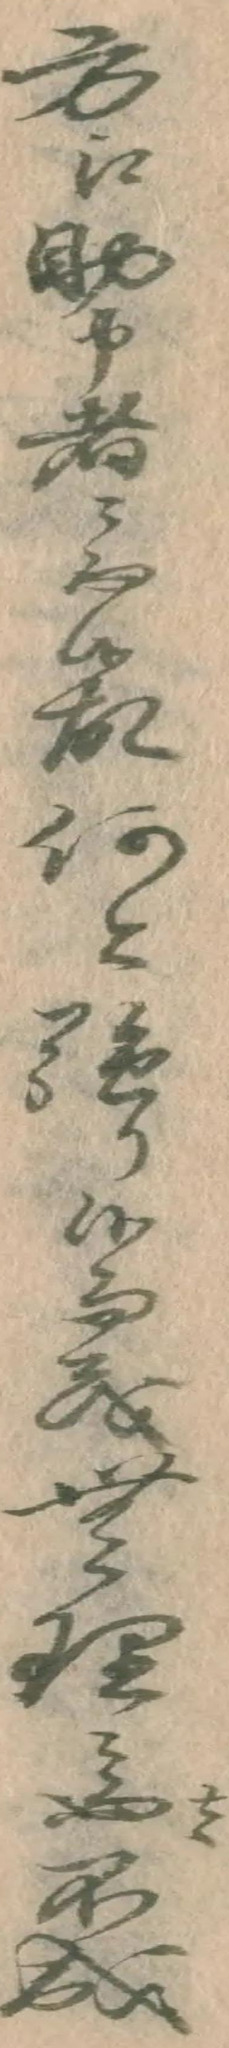方江助申者に而候故何と強り候而茂無理に而不成
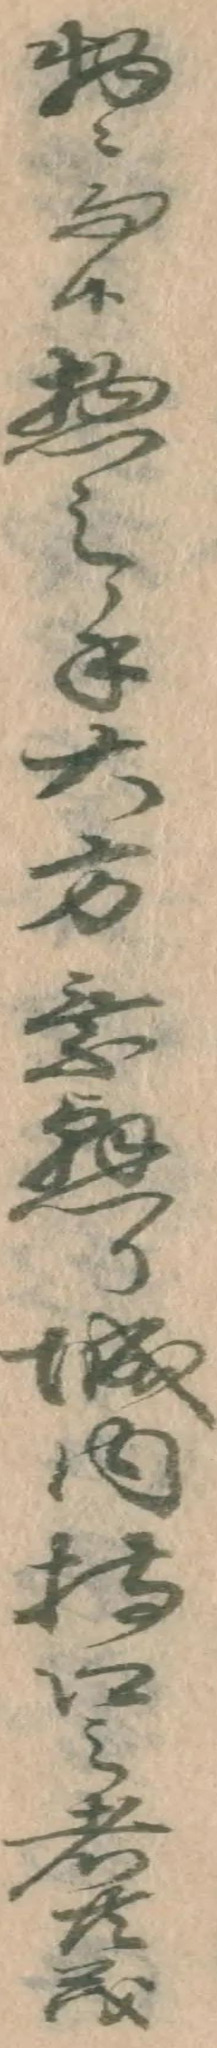物に而候惣之手大方乗懸り城内持口之者共茂
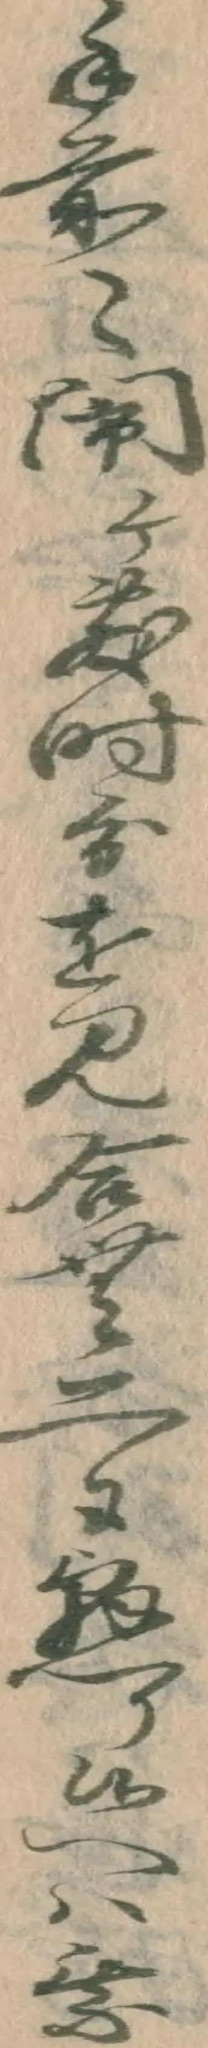手前に鬧け敷時分を見合無二尓懸り候へは乗
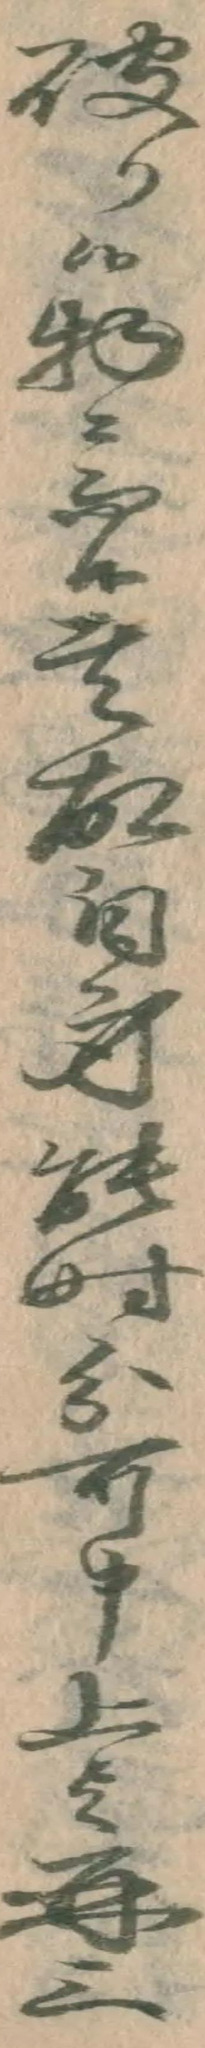破り候物に而候其故自身能時分可申上与再三
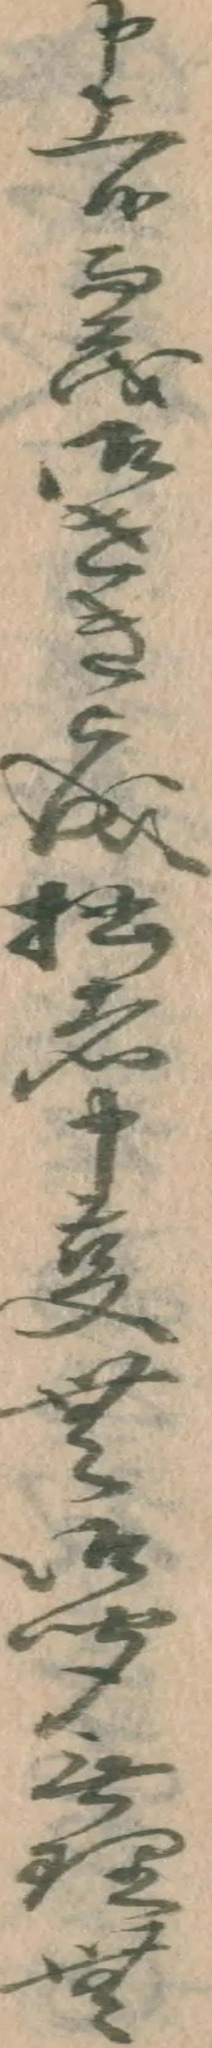申上候而茂御さき被成拙者申事無御聞無理無
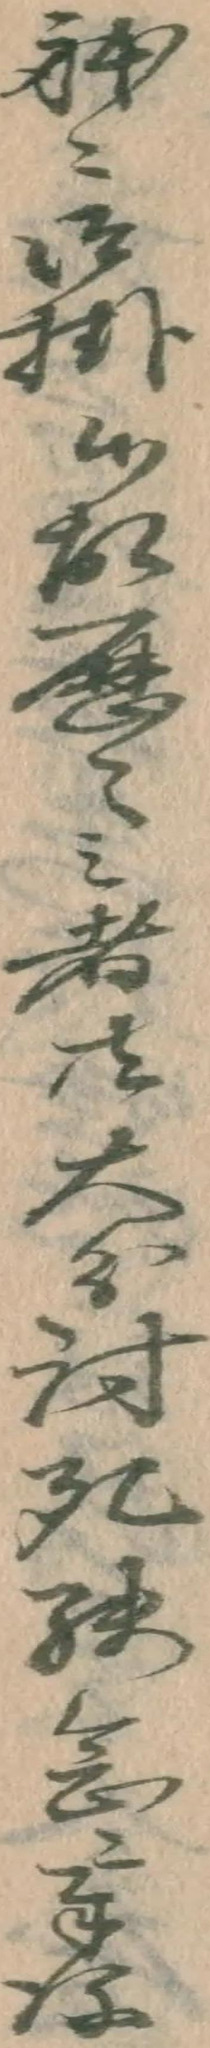躰に御掛候故歴々之者共大分討死残念に奉存
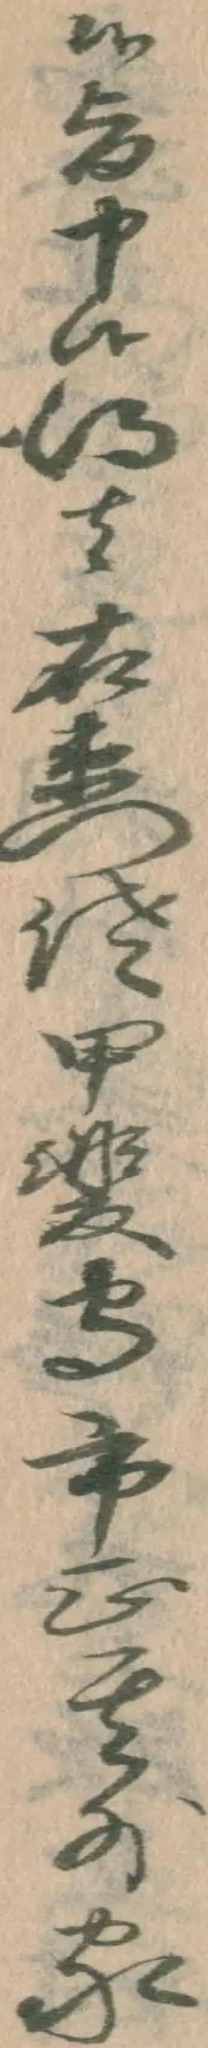候旨申候得者右衛門佐甲斐守市正其外家
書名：切支丹御退治記 49巻. [8]
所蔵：国立国会図書館 National Diet Library, JAPAN
